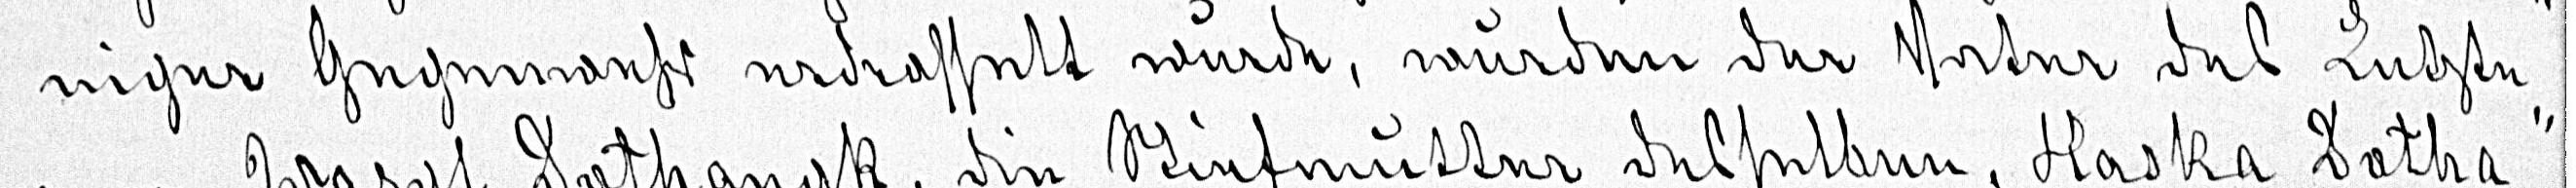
niger Gegenwehr erdrosselt wurde, wurden der Vater des Letzte¬
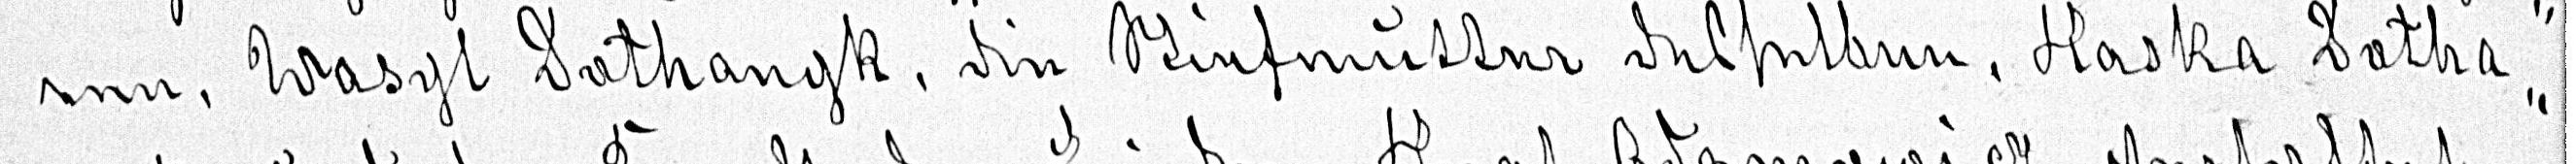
ren, Wasyl Dothanyk, die Stiefmutter desselben, Haska Dotha¬
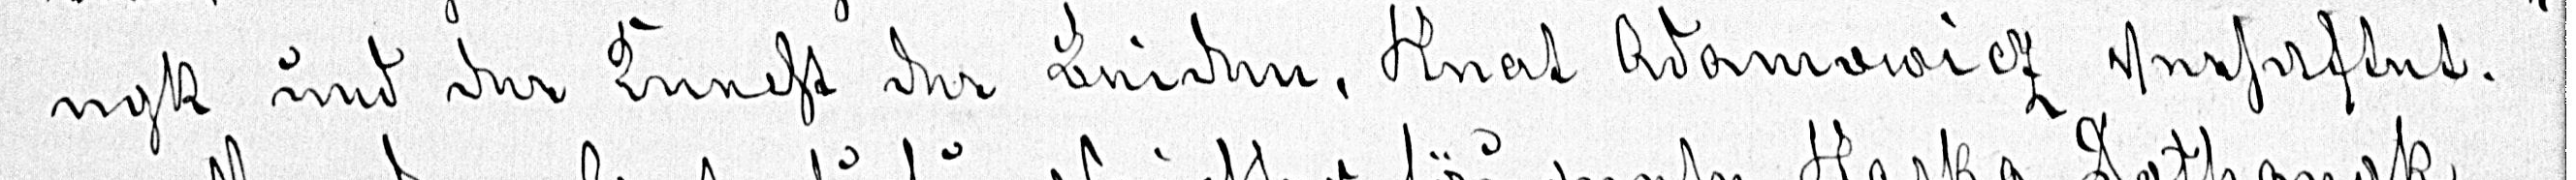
nyk und der Knecht der Beiden, Hnat Wamowicz verhaftet.
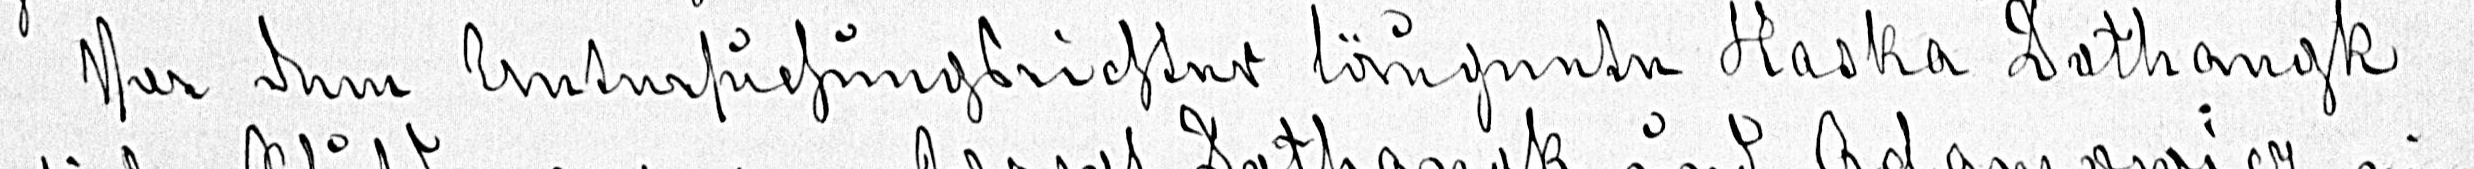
Vor dem Untersuchungsrichter läugente Haska Dothanyk
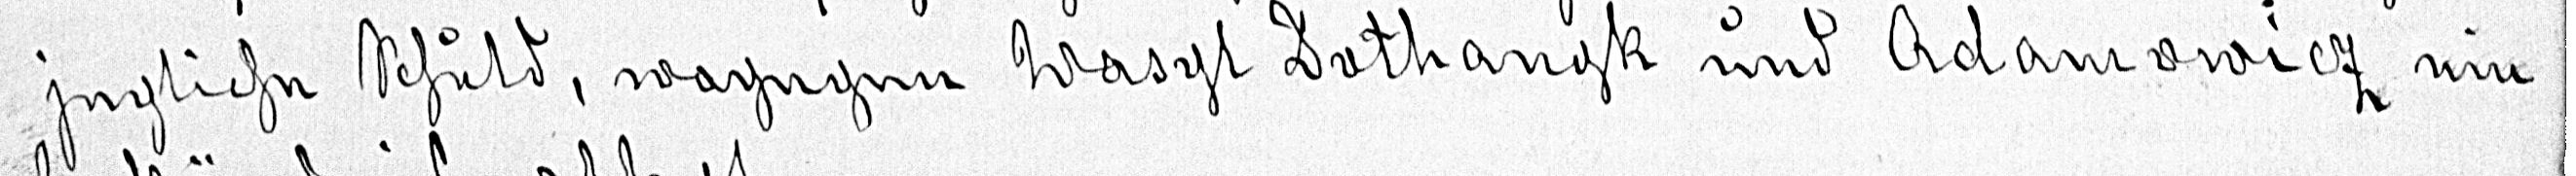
jegliche Schuld, wogegen Wasyl Dothanyk und Adamowicz ein
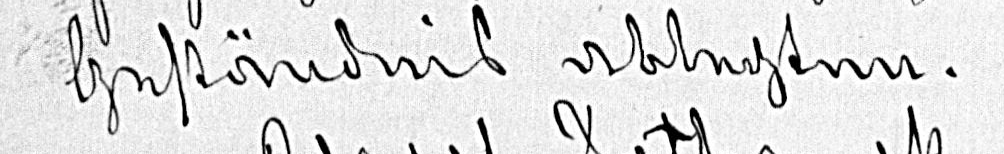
Geständnis ablegten.
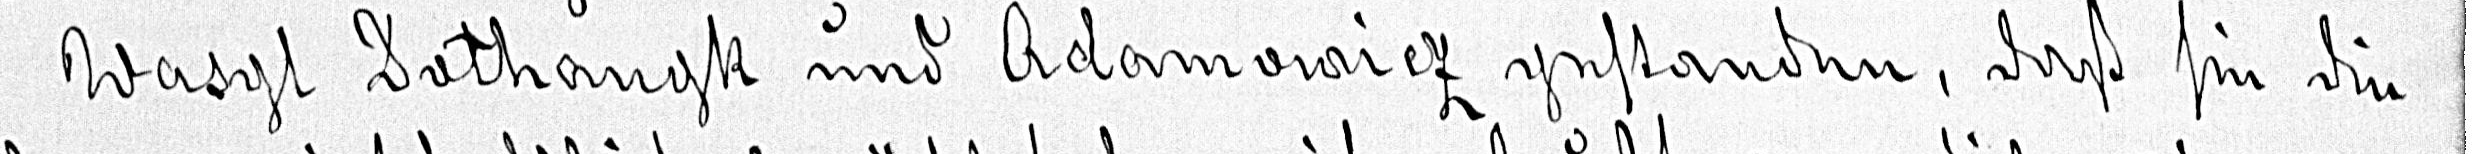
Wasyl Dothanyk und Adamowicz gestanden, daß sie die
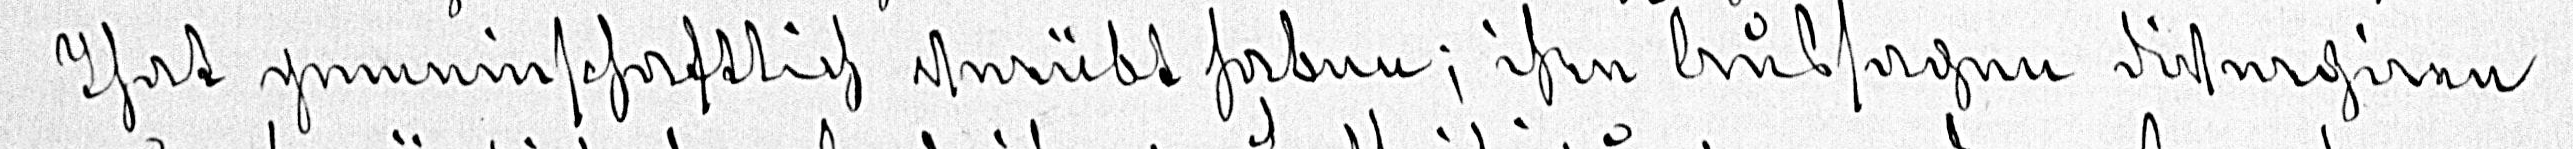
That gemeinschaftlich verübt haben; ihre Aussage divergiren
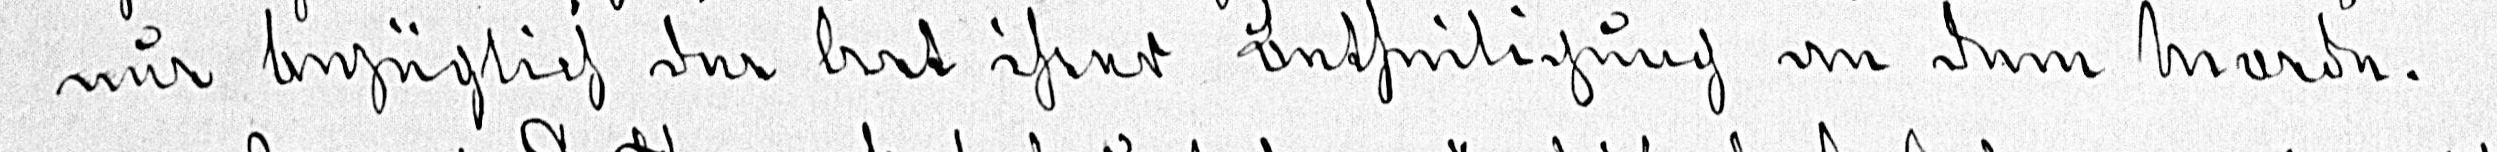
nur Anzüglich der Art ihrer Betheiligung an dem Morde.
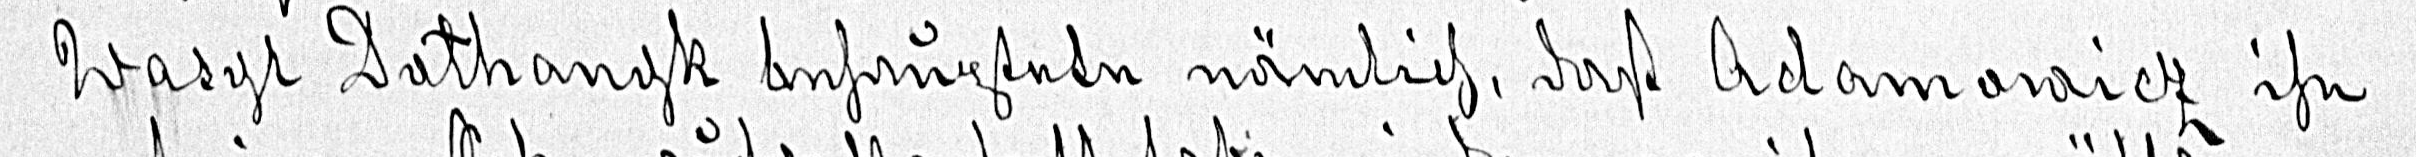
Wasyl Dothanyk behauptete nämlich, daß Adamowicz ihn
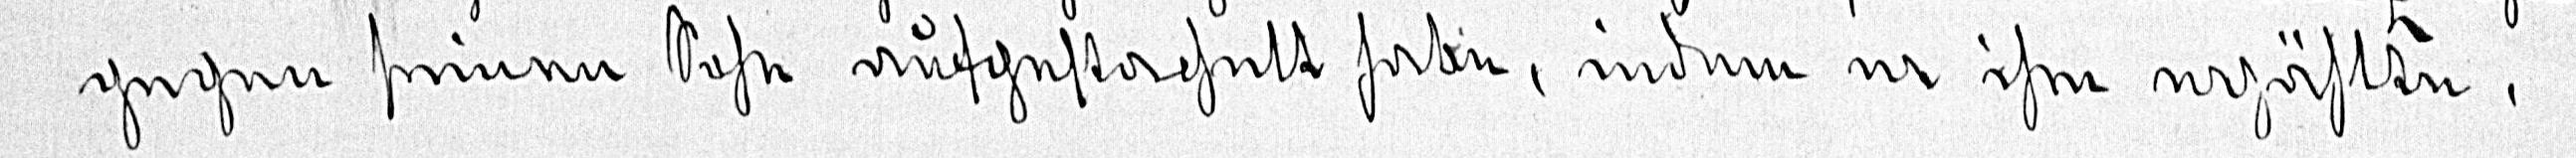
gegen seinen Sohn aufgestachelt habe, indem er ihm erzählte,
